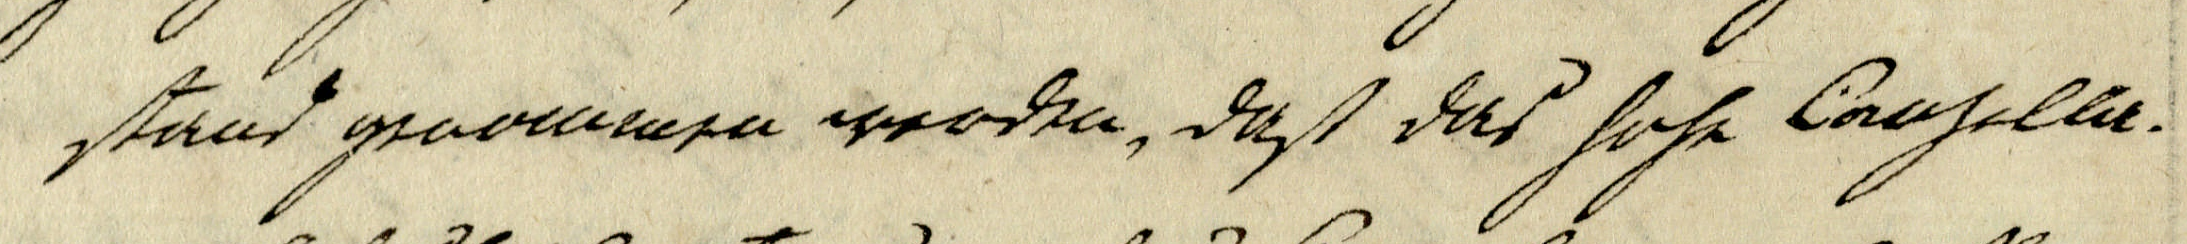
stand genommen werden, daß das hohe Canzella¬
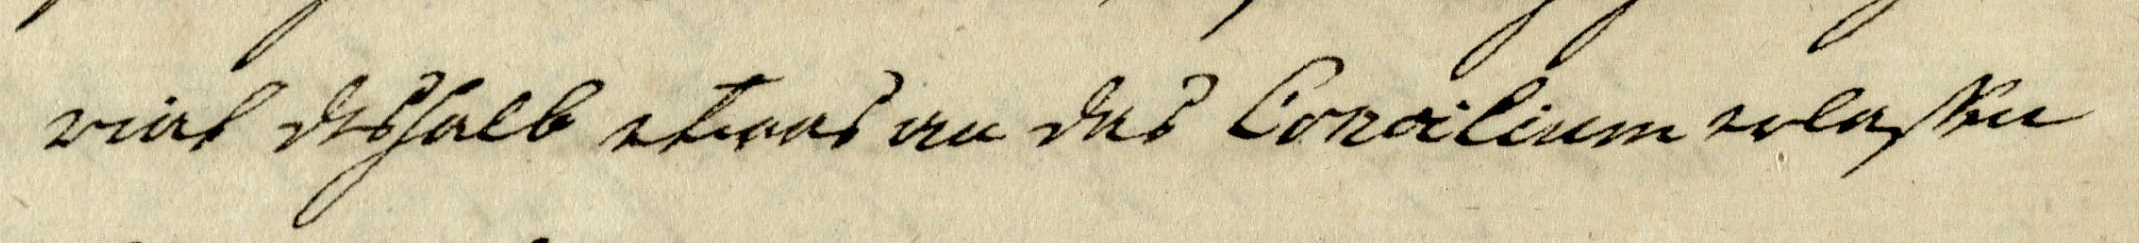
riat deshalb etwas an das Concilium erlassen
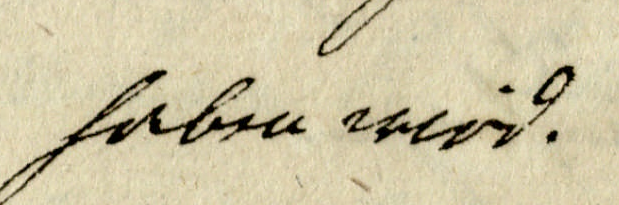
haben wird.
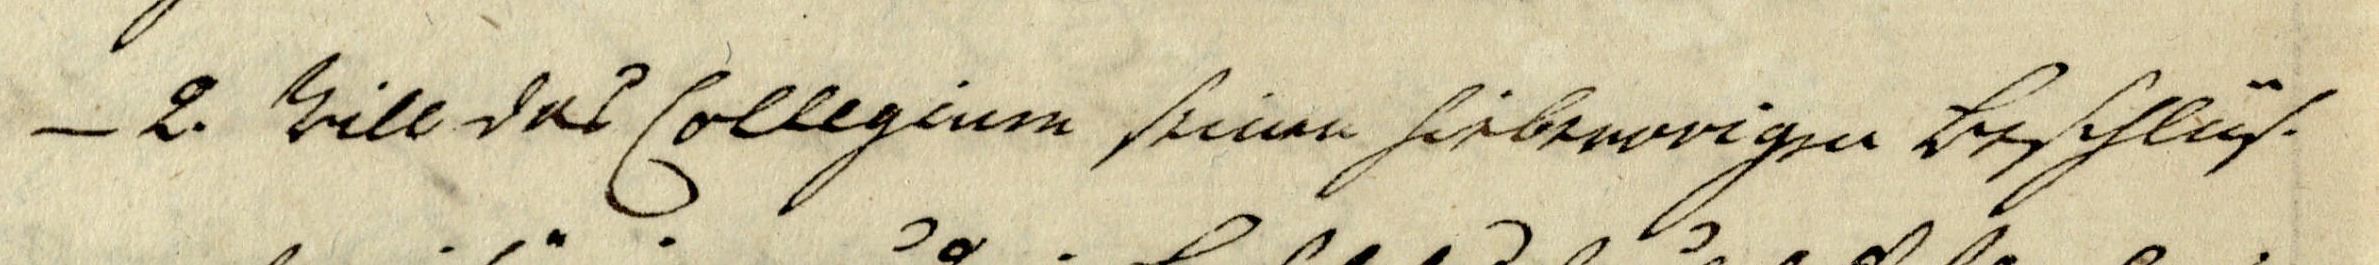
2. Will das Collegium seinen hiebevorigen Beschlüs¬
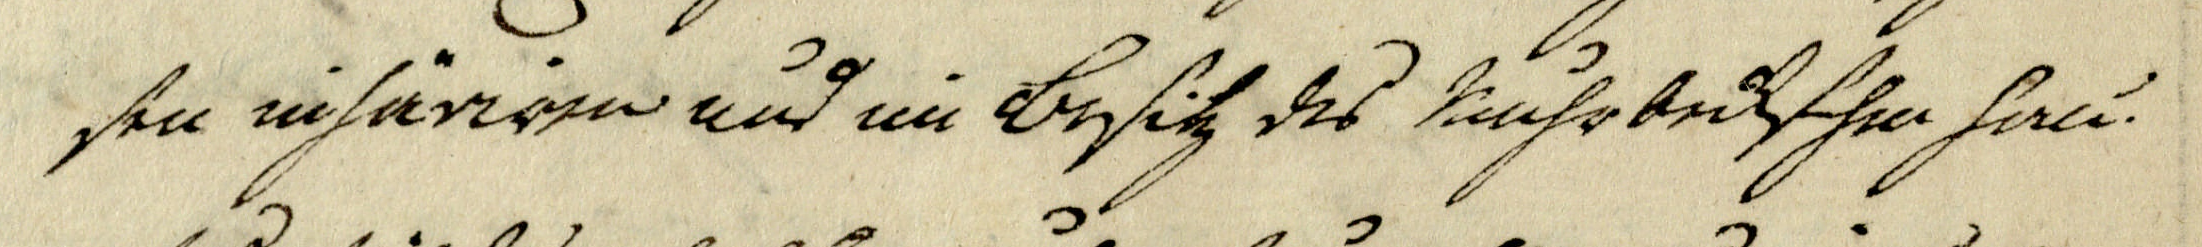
sen inhäriren und im Besitz des Muhrbeckschen Hau¬
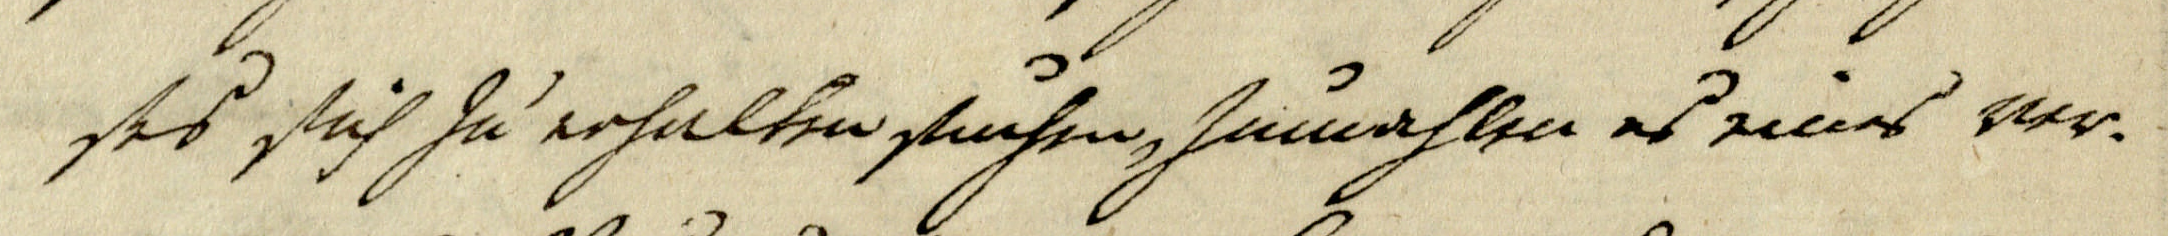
ses sich zu erhalten suchen, zumahlen es eines ver¬
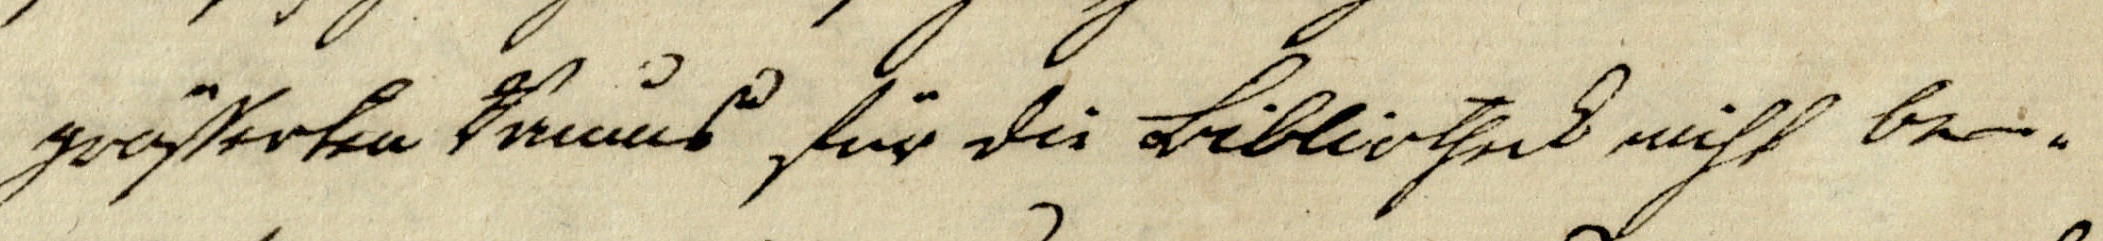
grösserten Raums für die Bibliothek nicht be¬
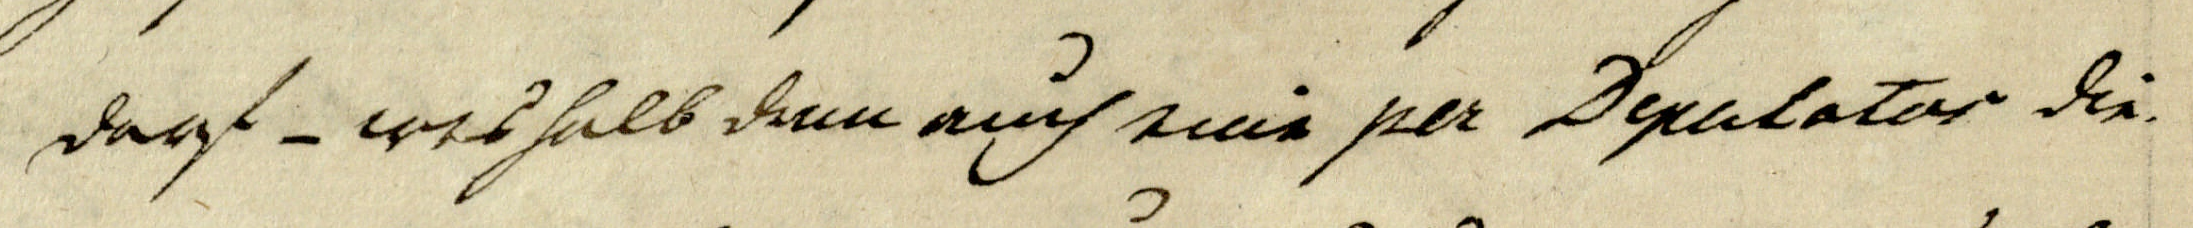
darf - weshalb denn auch eine per Deputatos die¬
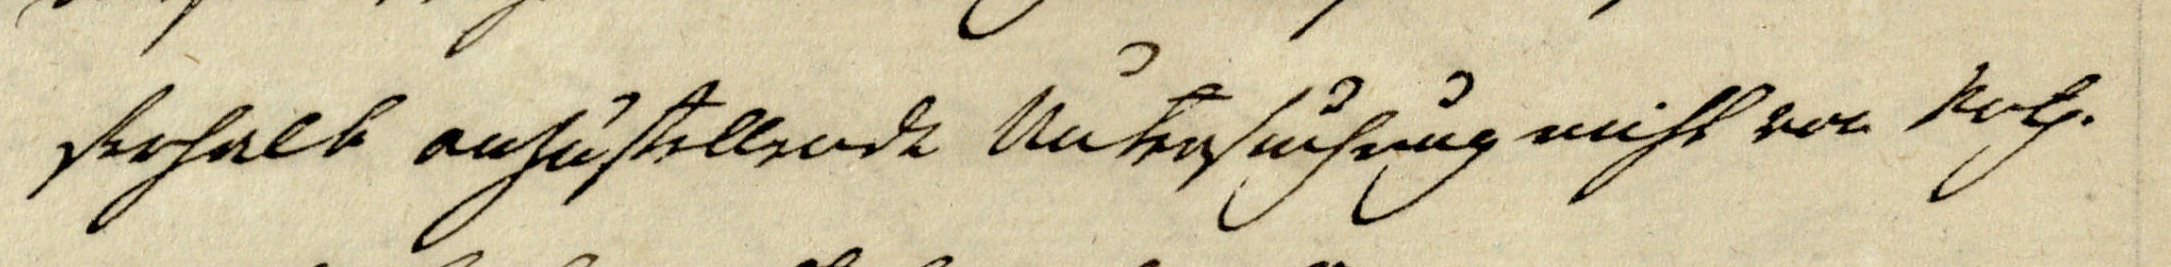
serhalb anzustellende Untersuchung nicht von Noth¬
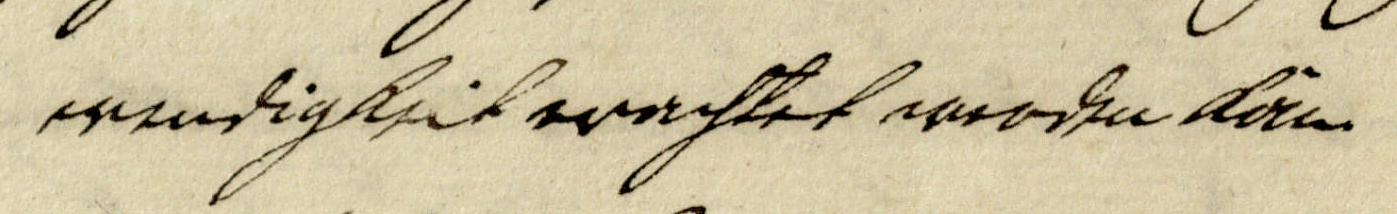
wendigkeit erachtet werden kan.
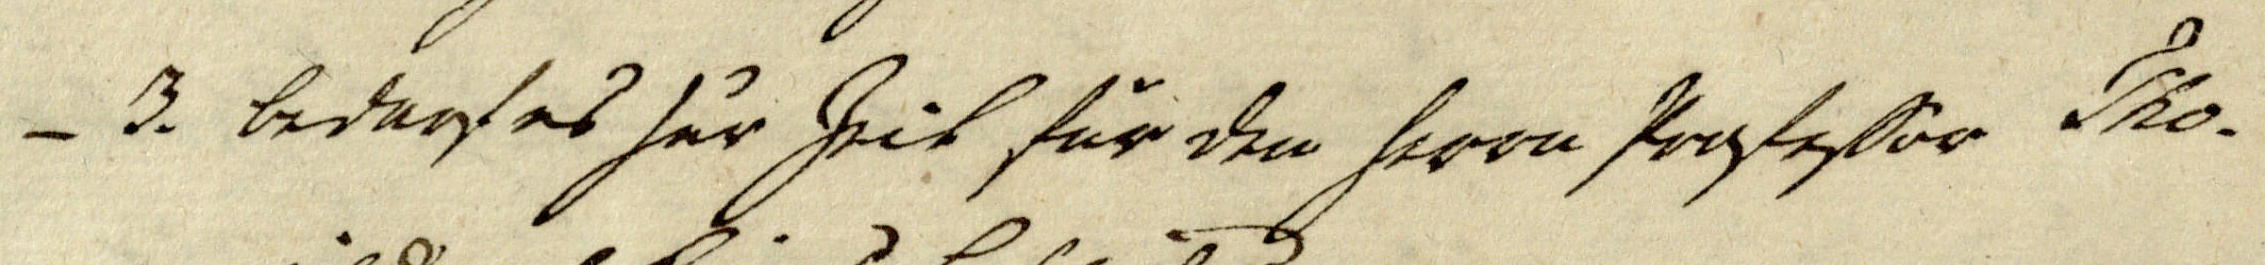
3. bedarf es zur Zeit für den Herrn Professor Tho¬
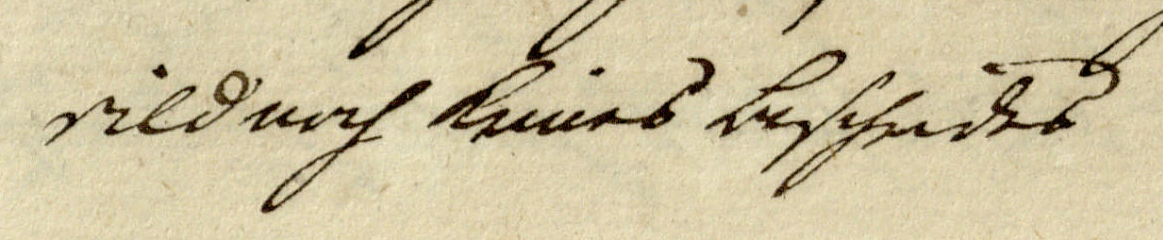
rild noch keines Bescheides.
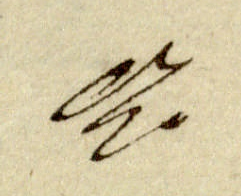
dh.
